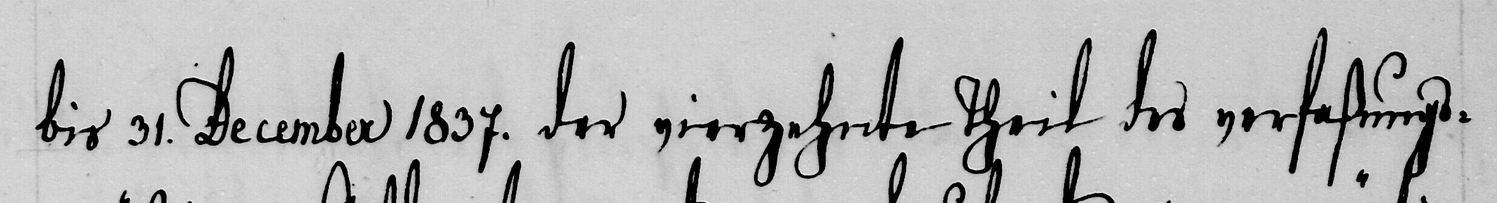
bis 31. December 1837. der vierzehnte Theil des verfaßungs¬
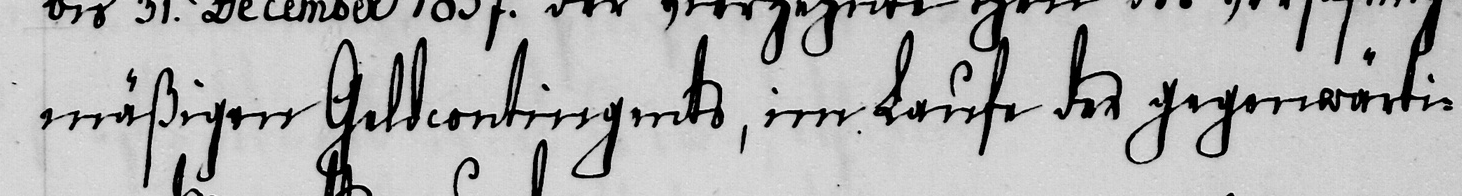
mäßigen Geldcontingents, im Laufe des gegenwärti¬
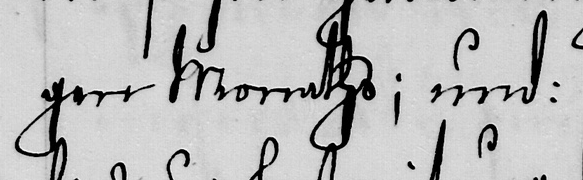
gen Monaths; und:
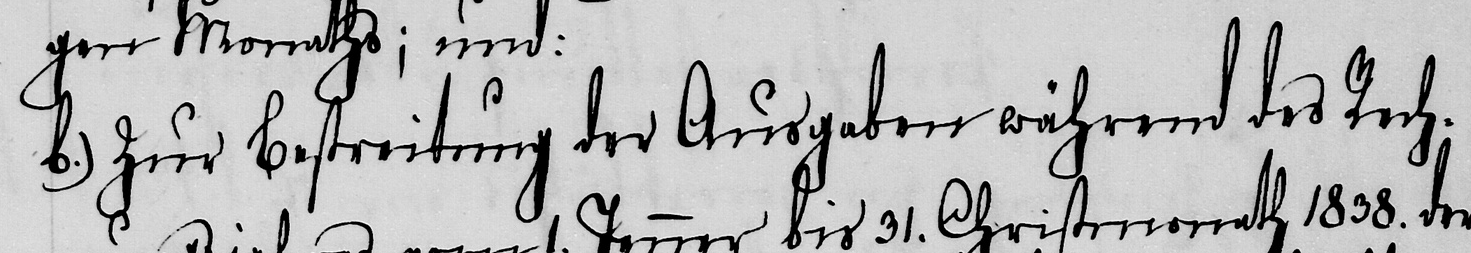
b.) Zur Bestreitung der Ausgaben während des Rech¬
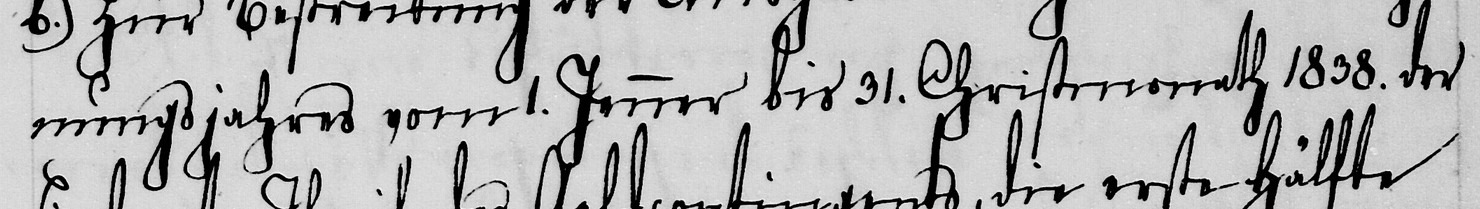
nungsjahres vom 1. Jenner bis 31. Christmonath 1838. der
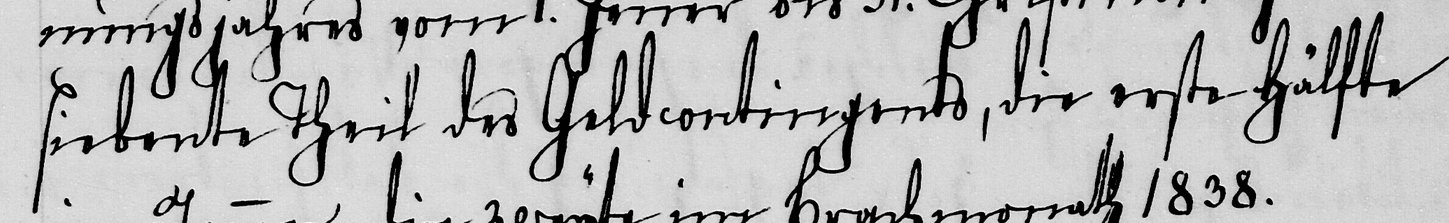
siebente Theil des Geldcontingents, die erste Hälfte
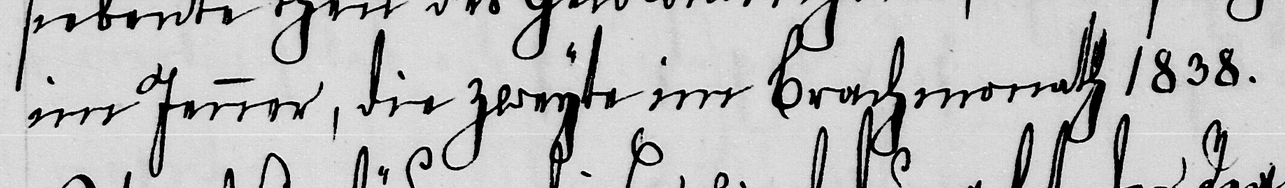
im Jenner, die zweyte im Brachmonath 1838.
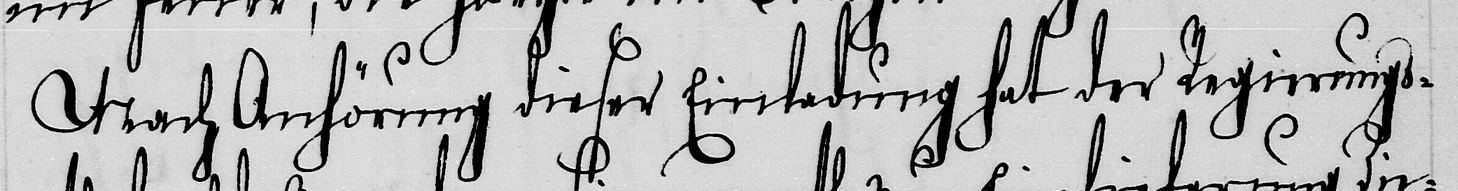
Nach Anhörung dieser Einladung hat der Regierungs¬
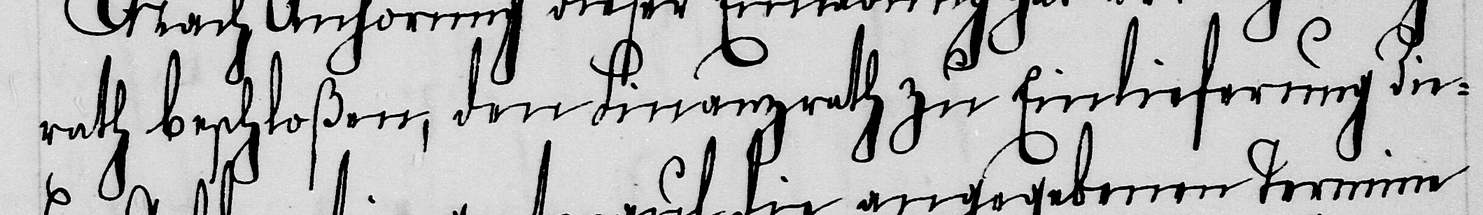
rath beschloßen, den Finanzrath zu Einlieferung die¬
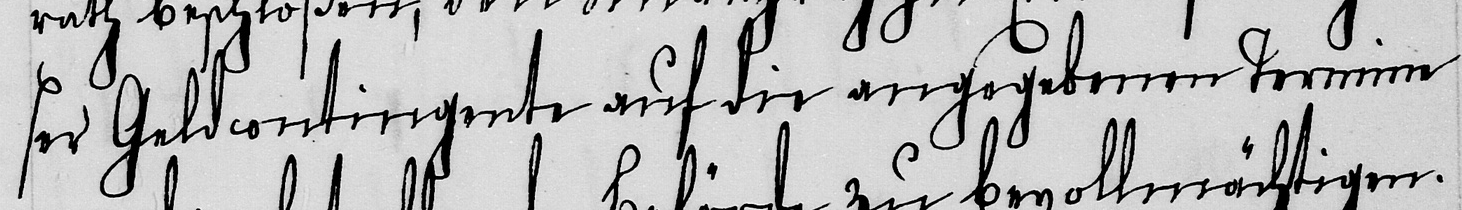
ser Geldcontingente auf die angegebenen Termine
